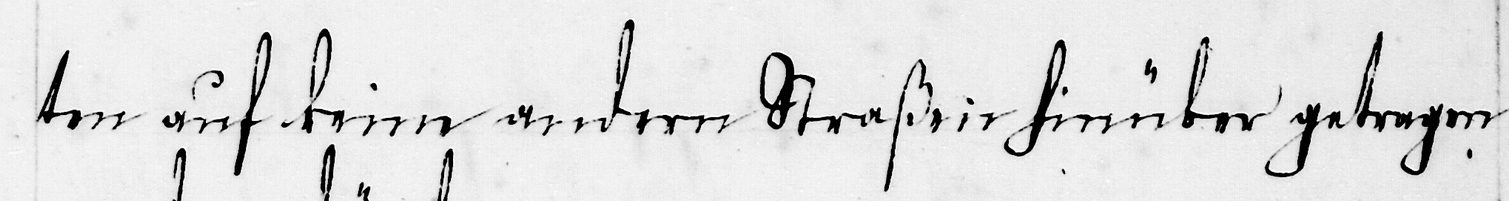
ten auf keine andern Straßen hinüber getragen
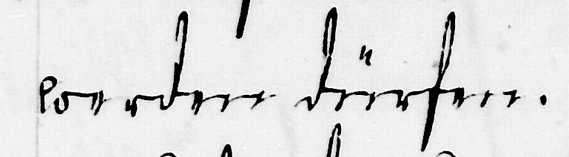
werden dürfen.
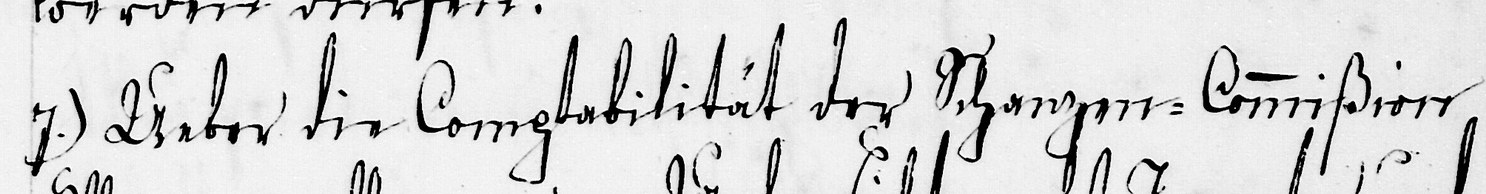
7.) Ueber die Comptabilität der Schanzen-Commißion
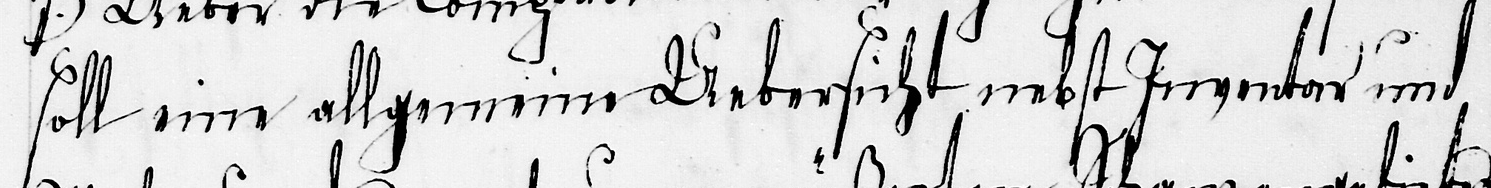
soll eine allgemeine Uebersicht nebst Inventar und
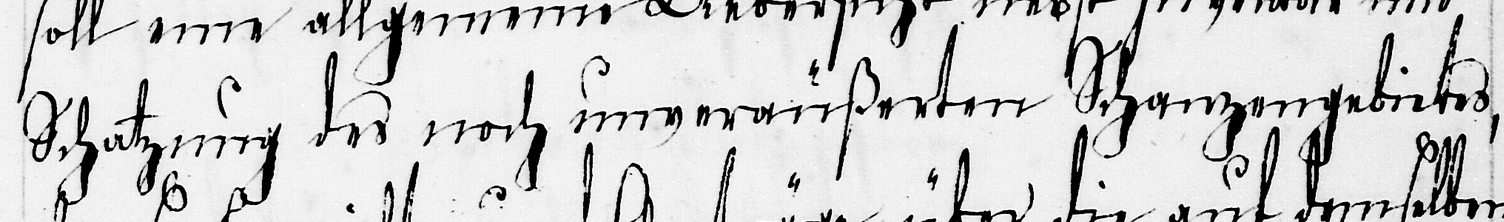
Schatzung des noch unveräußerten Schanzengebietes,
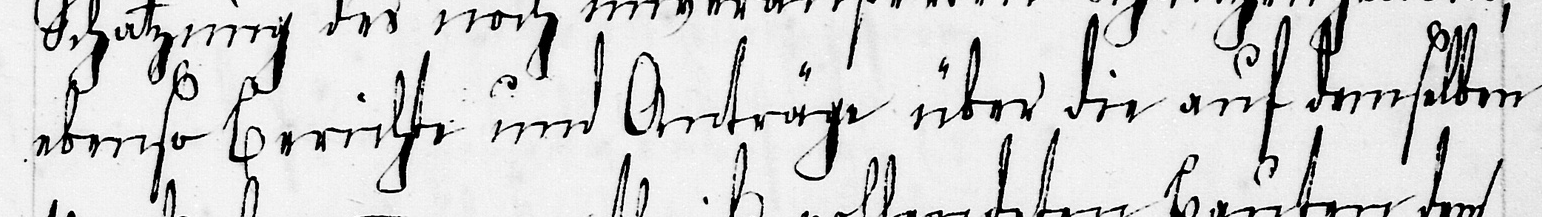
ebenso Berichte und Anträge über die auf demselben
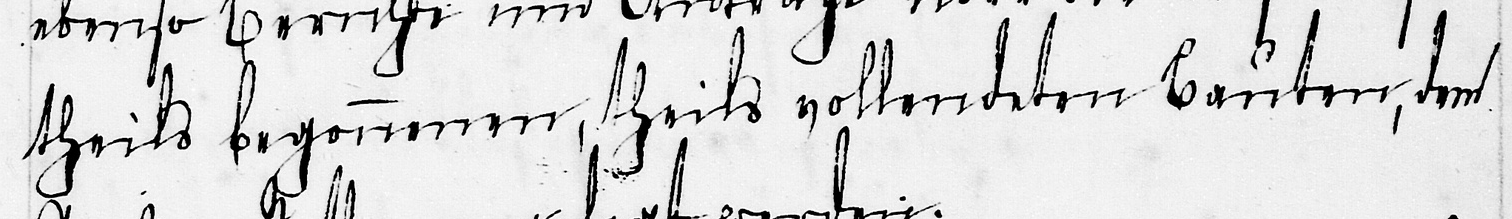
theils begonnenen, theils vollendeten Bauten, dem
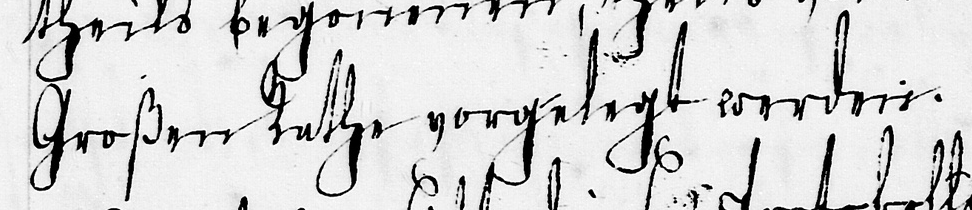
Großen Rathe vorgelegt werden.
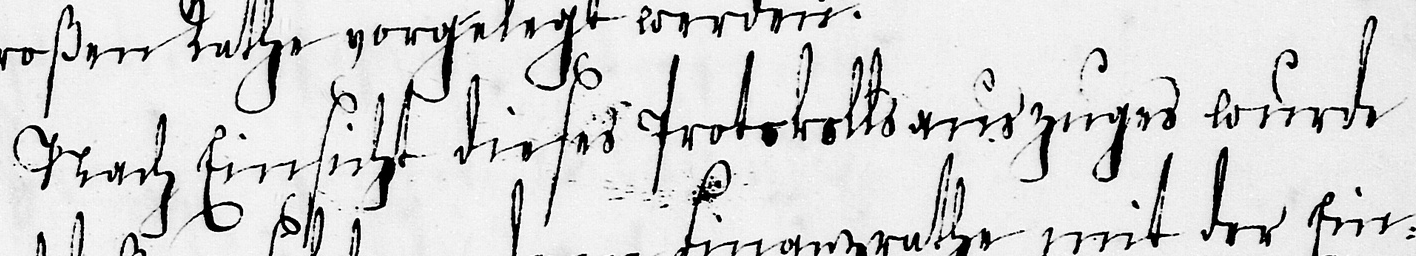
Nach Einsicht dieses Protokollsauszuges wurde
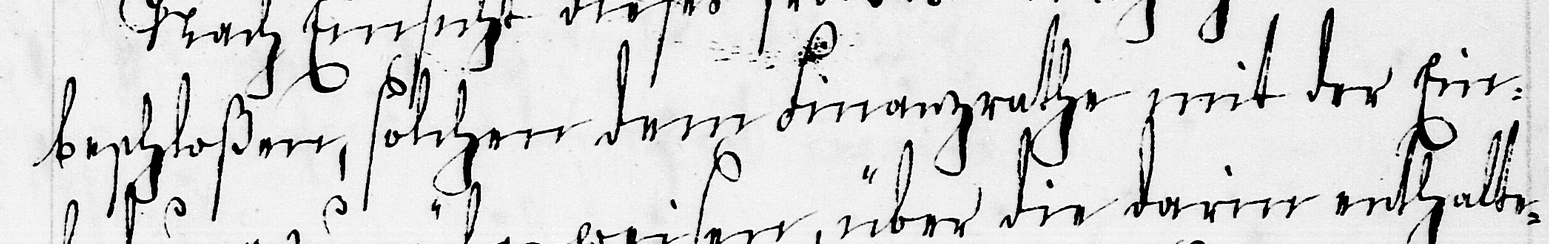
beschloßen, solchen dem Finanzrathe mit der Ein¬
